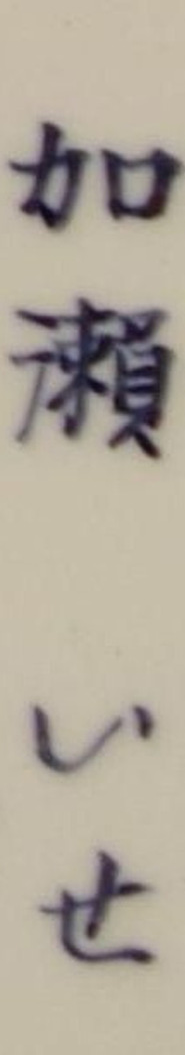加瀬いせ
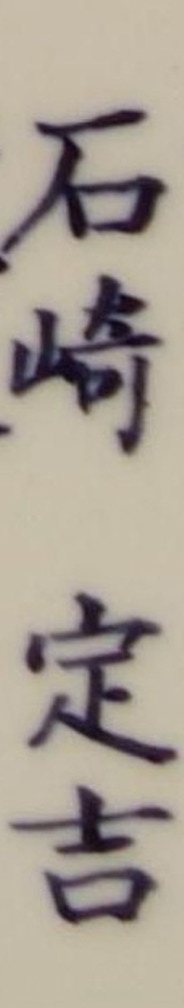石崎定吉
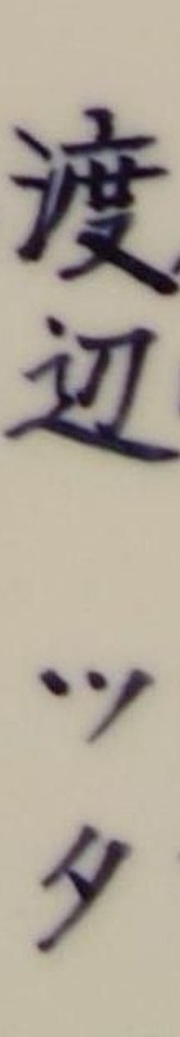渡辺ツタ
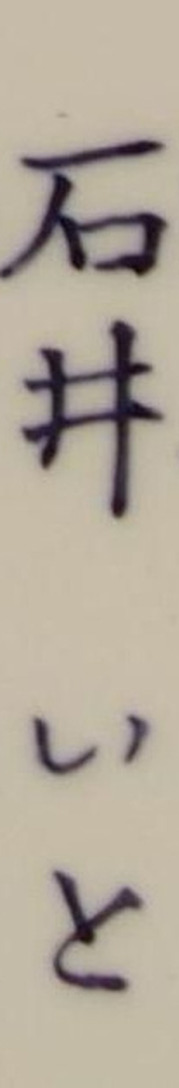石井いと
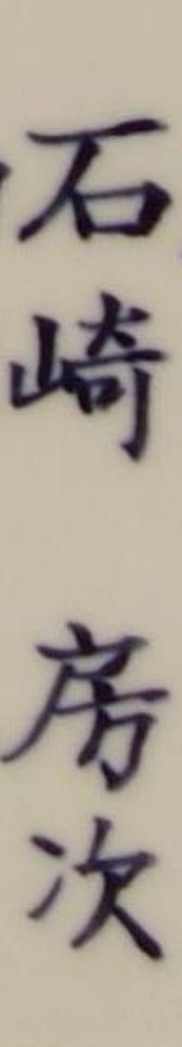石崎房次
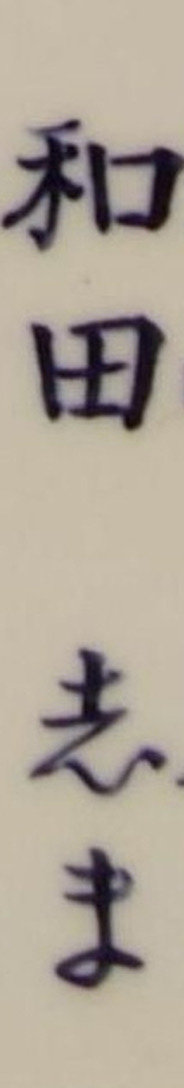和田しま
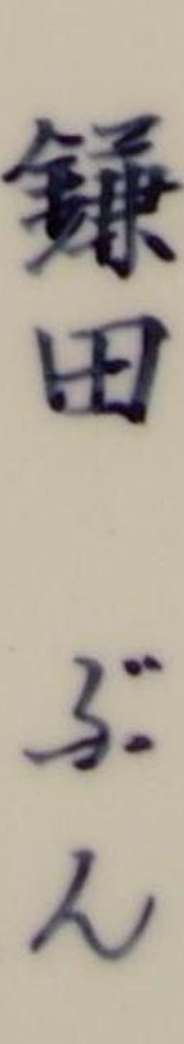鎌田ぶん
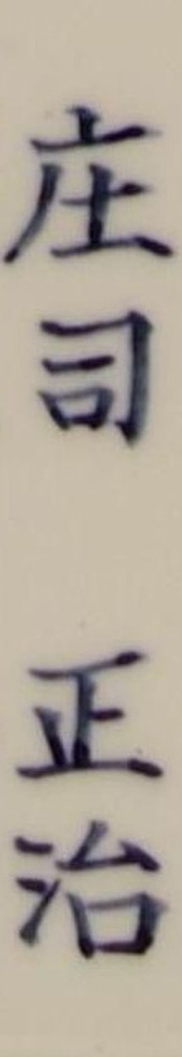庄司正治
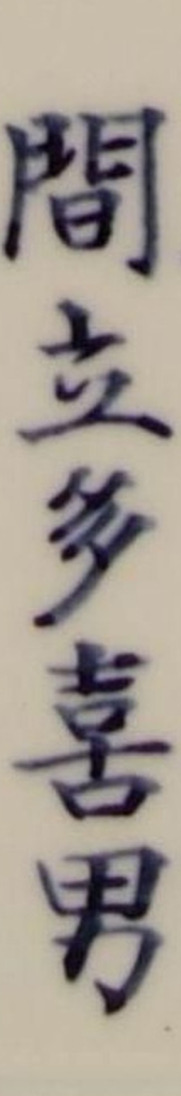間立多喜男
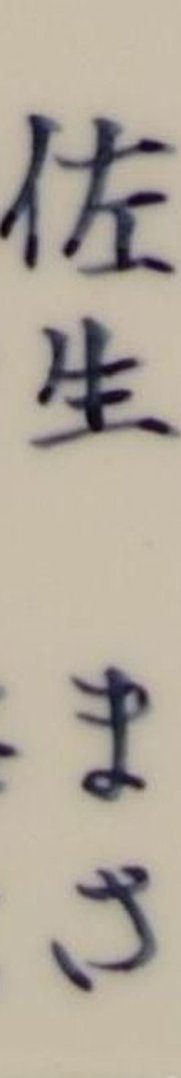佐生まさ
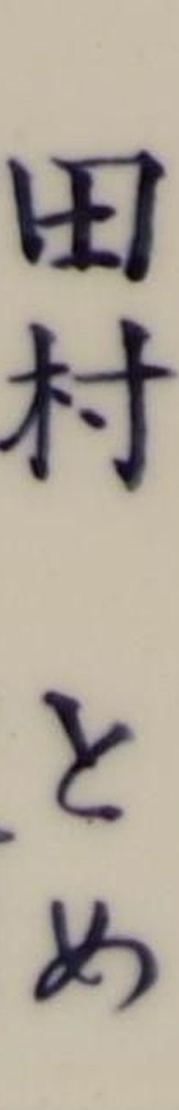田村とめ
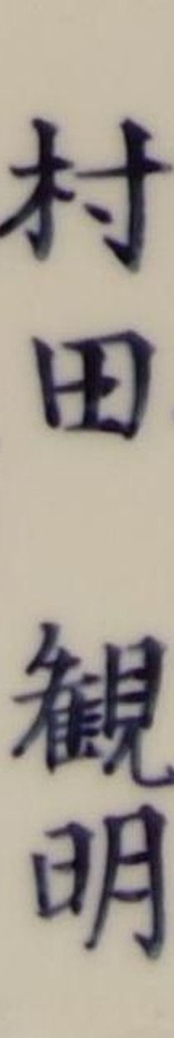村田観明
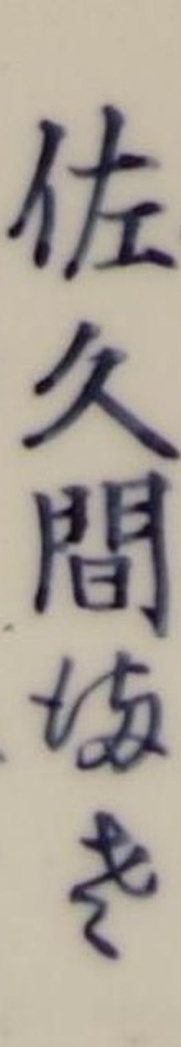佐久間まさ
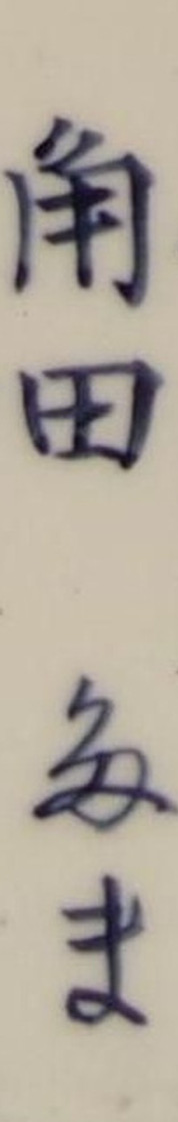角田たま
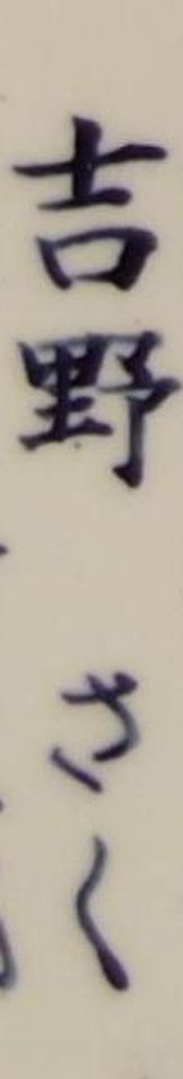吉野さく
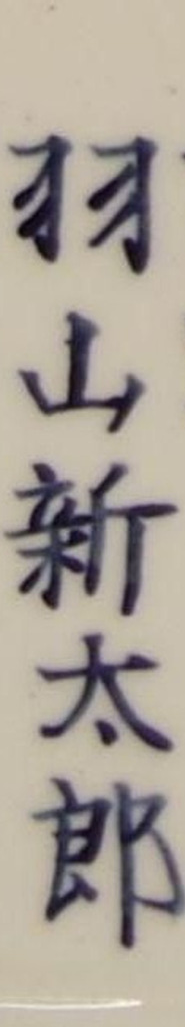羽山新太郎
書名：E~L
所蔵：高野山金剛峯寺
